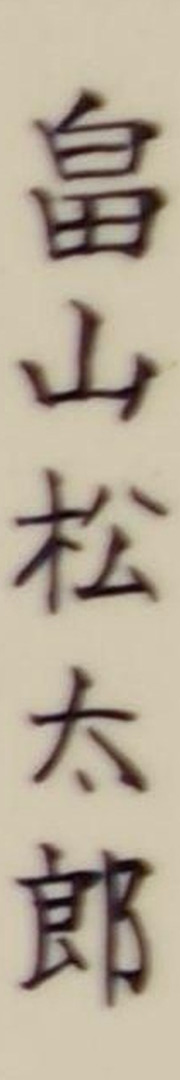畠山松太郎
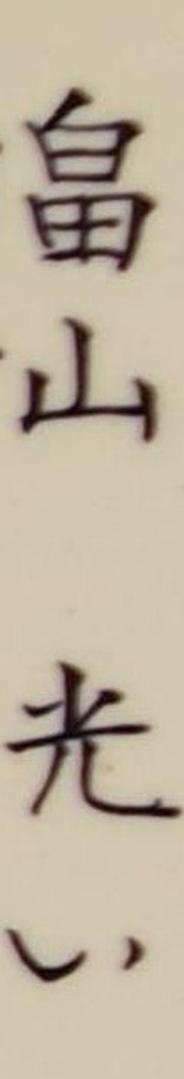畠山光い
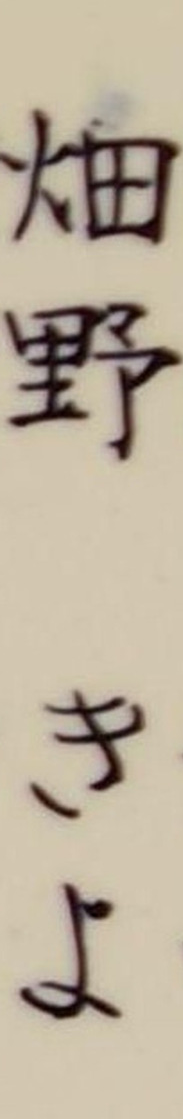畑野きよ
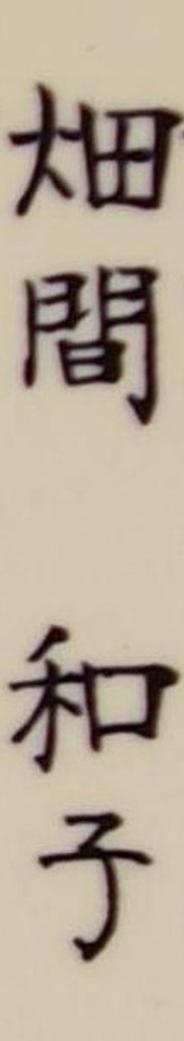畑間和子
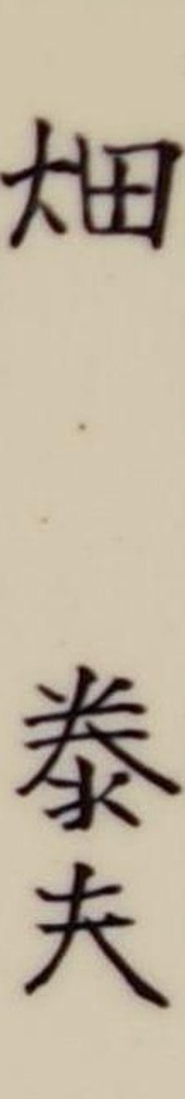畑泰夫
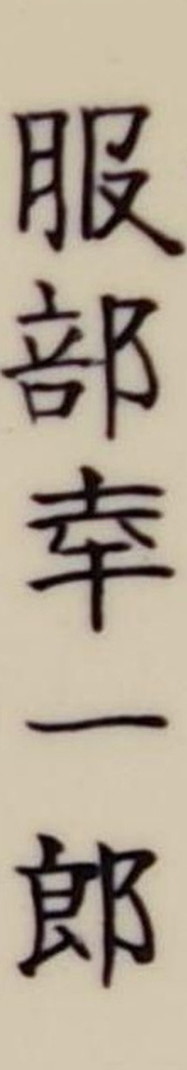服部幸一郎
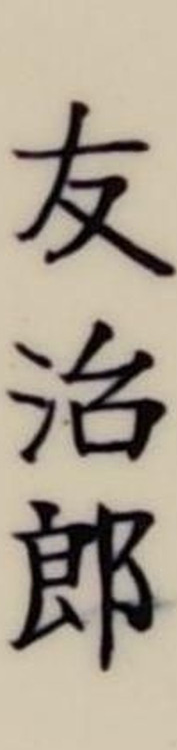友治郎
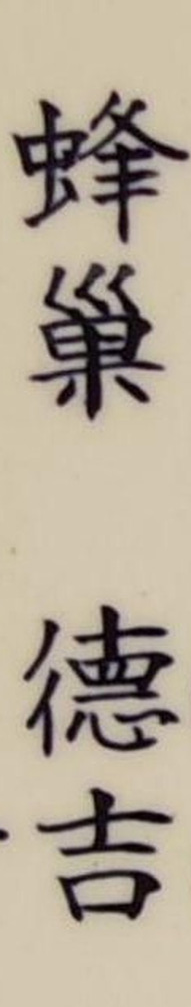蜂巣徳吉
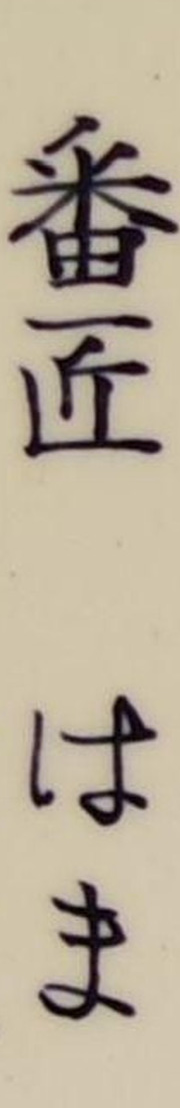番匠はま
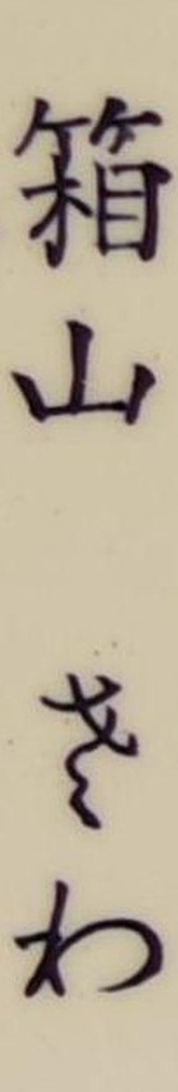箱山さわ
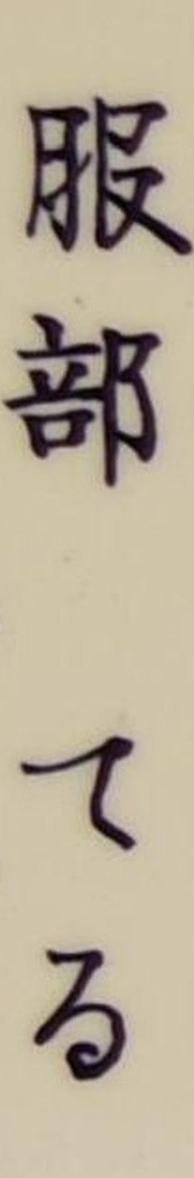服部てる
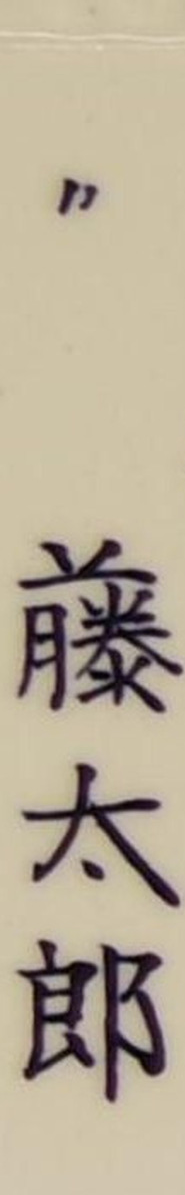藤太郎
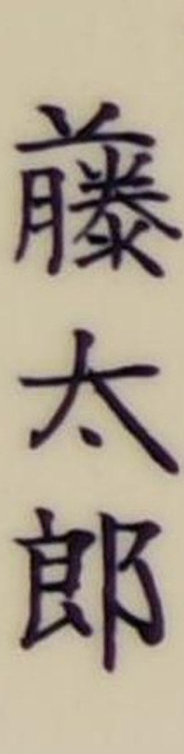藤太郎

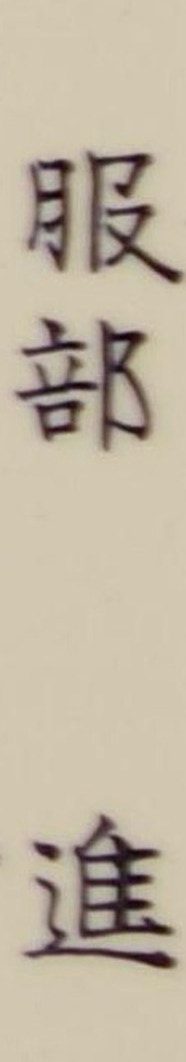服部進
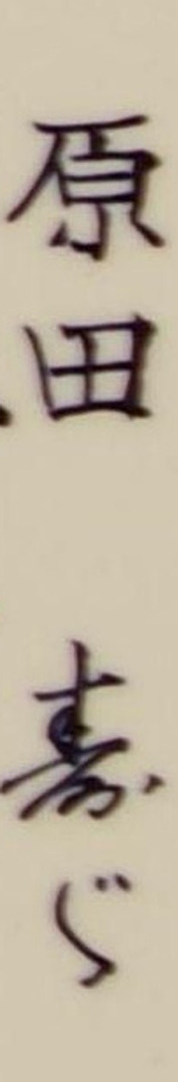原田寿ゞ
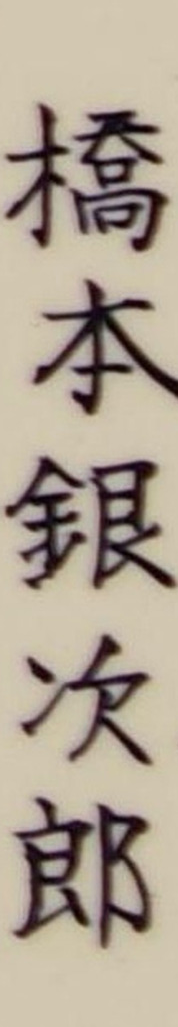橋本銀次郎
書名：A~D
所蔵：koyasan kongobuji
